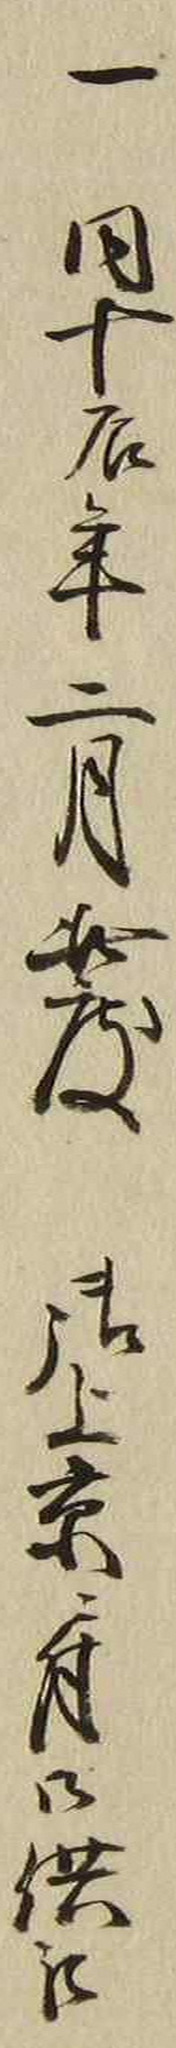一月十辰年二月此度御上京に付御供被
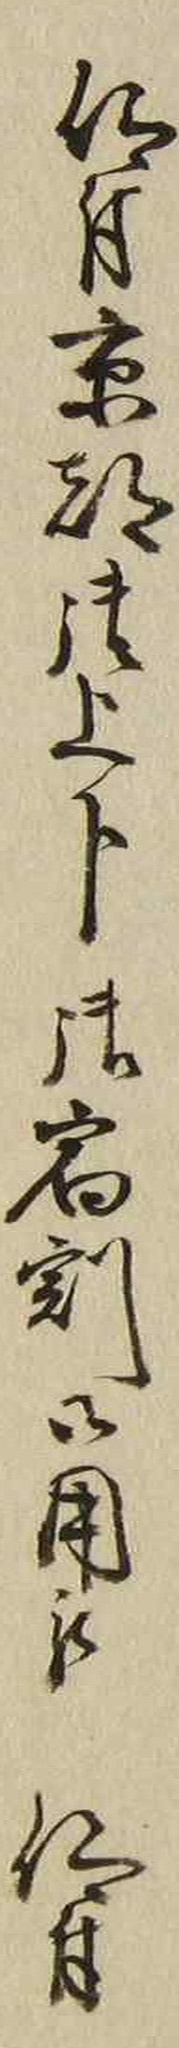仰付京都御上下御宿割御用被仰付

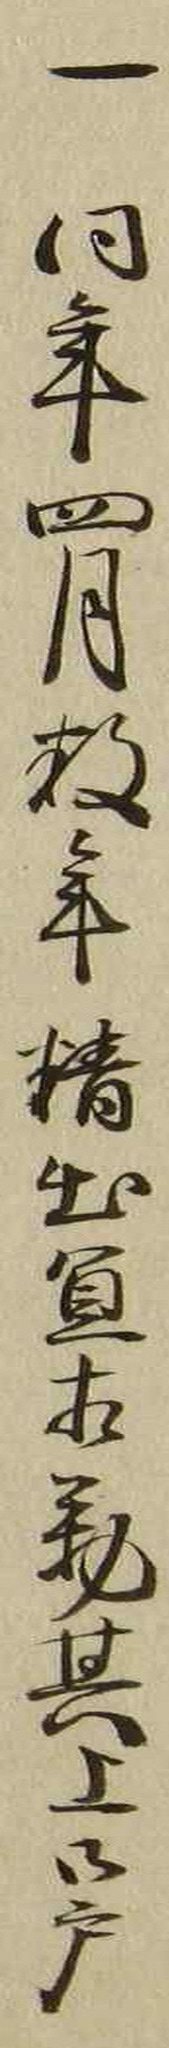一同年四月数年精出宣相勤其上御戸
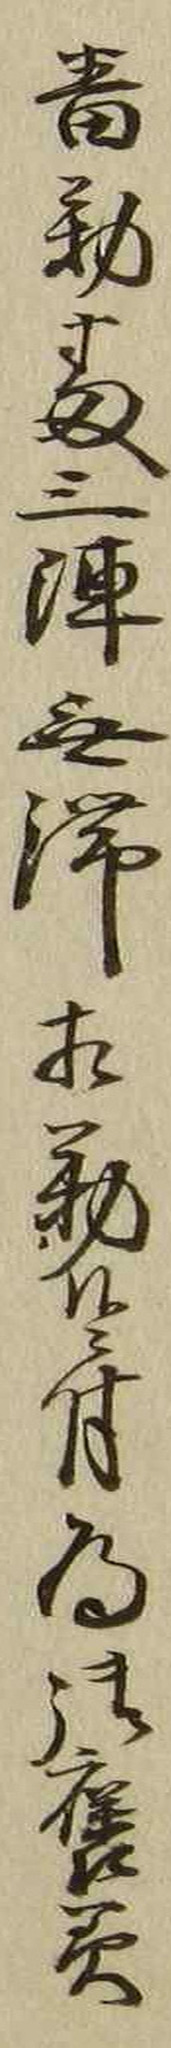番勤番三陣無滞相勤候に付為御褒美
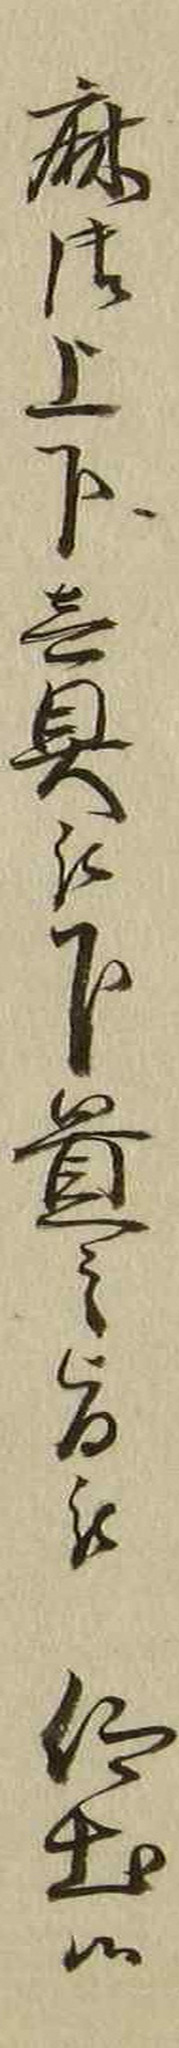麻御上下壱具被下置之旨被仰出候
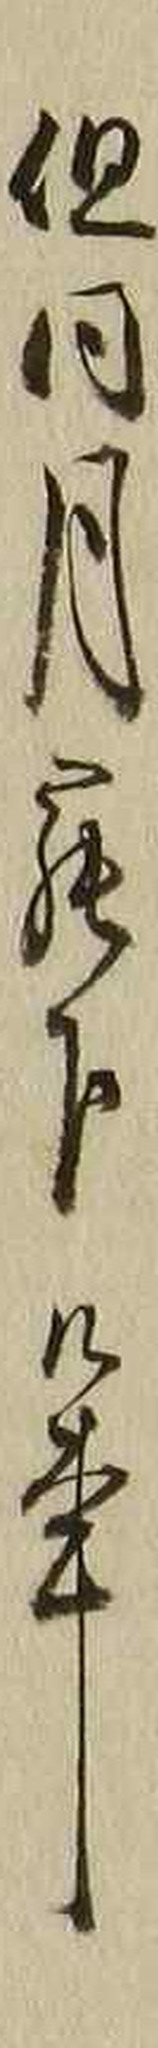但同月罷下候事
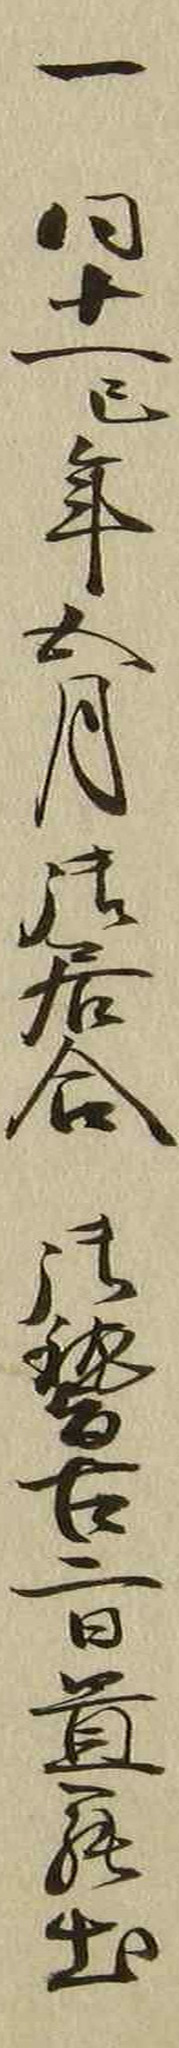一同十一巳年五月御居合御稽古二日置罷出
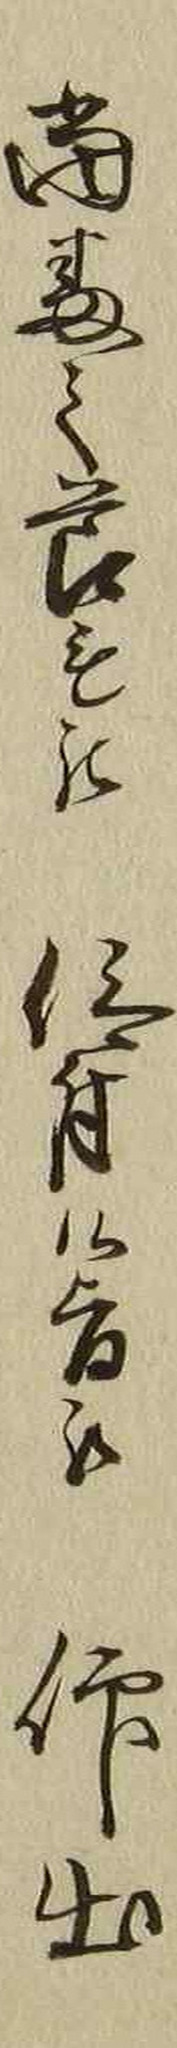当番之節も被仰付候旨被仰出
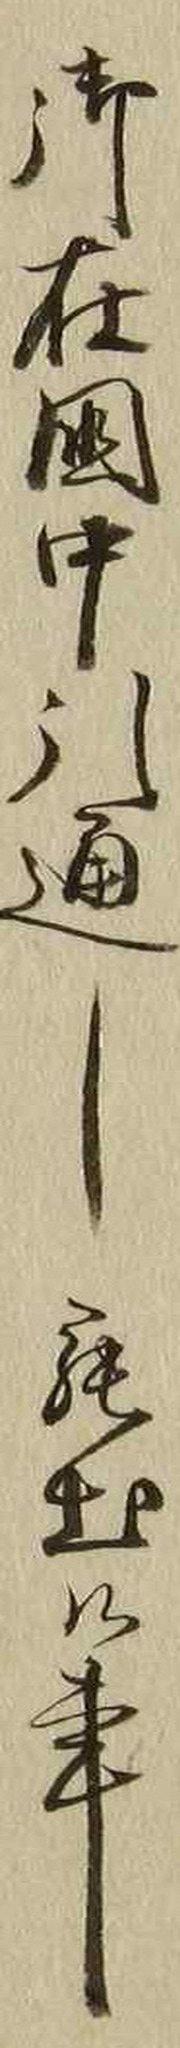御在国中引通し罷出候事
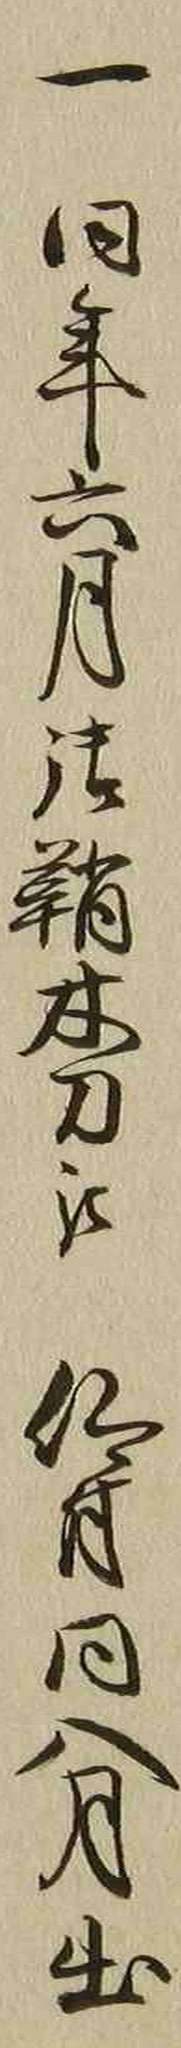一同年六月御鞘木刀被仰付同八月出
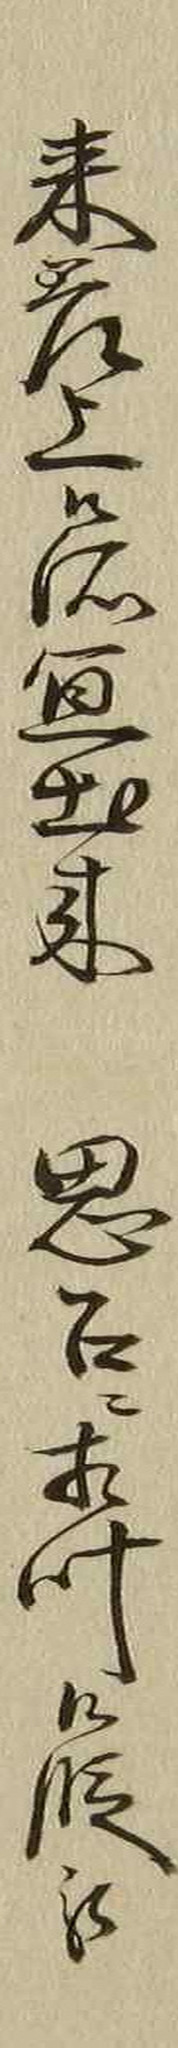来差上候所宜出来思召に相叶候段被
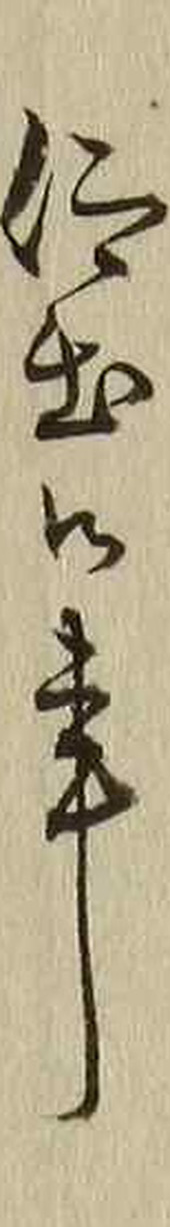仰出候事
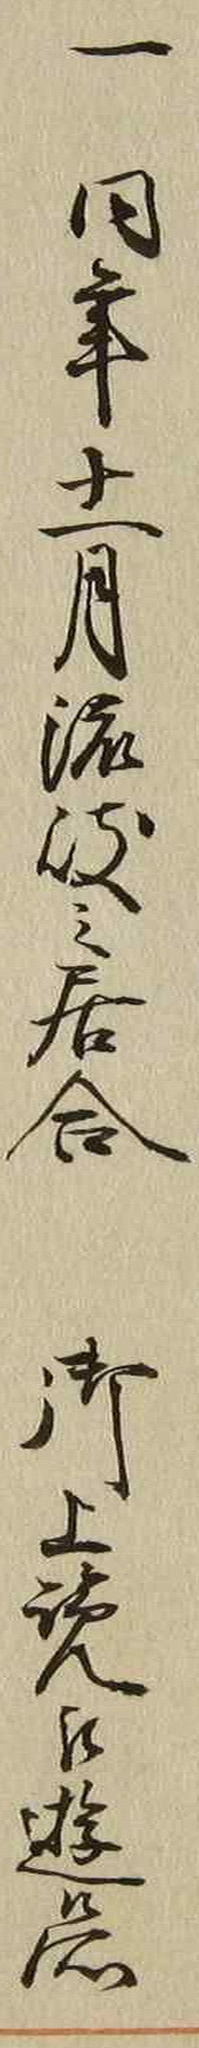一同年十一月流岐之居合御上覧被遊候所
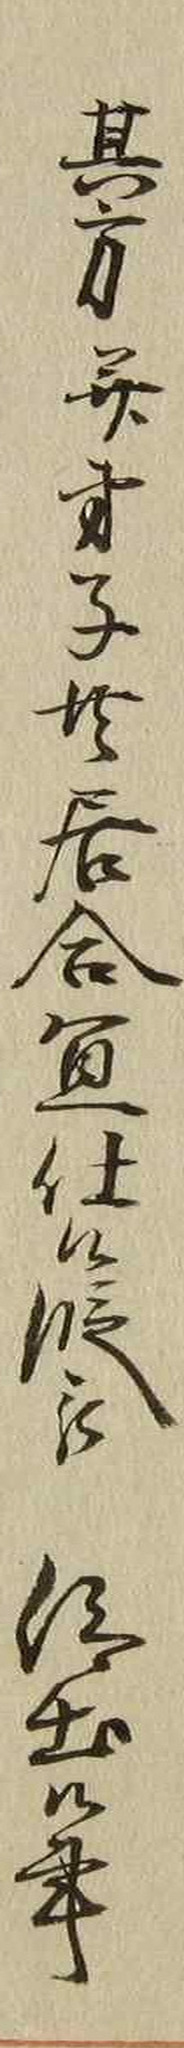其方并第子共居合宣仕候段被仰出候事
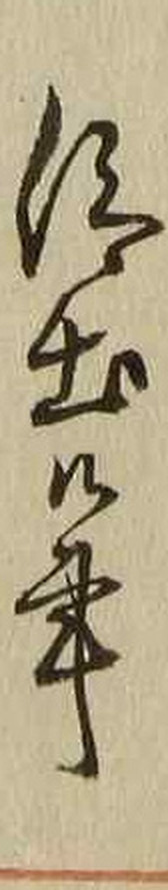仰出候事
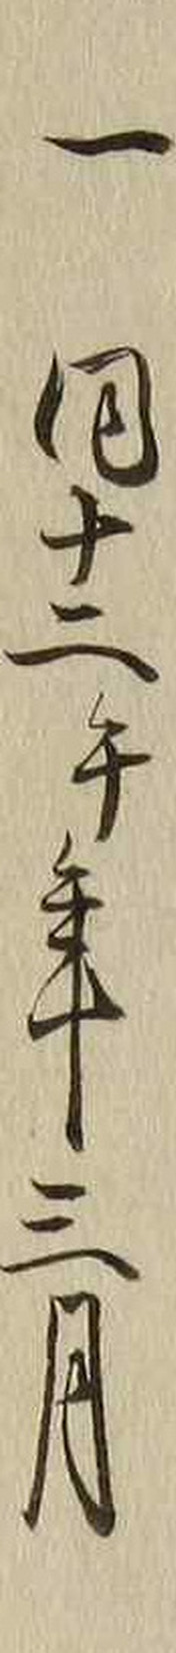一同十二午年三月
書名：諸士系譜　巻之67　を之部1
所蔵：会津若松市立会津図書館
